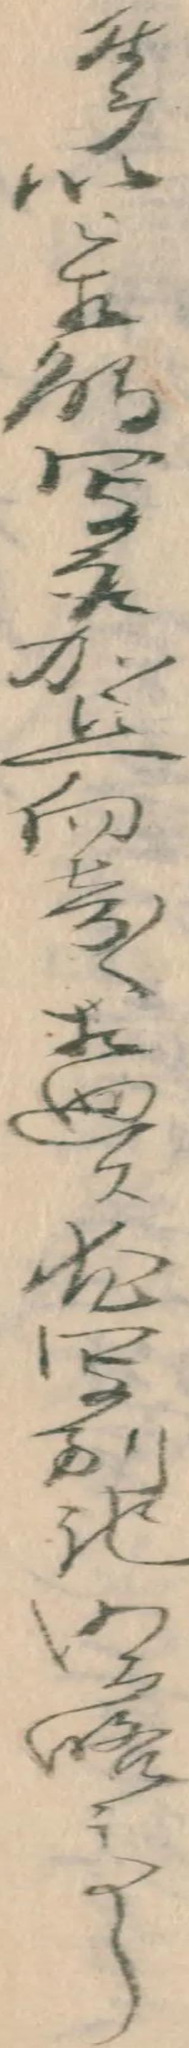付テ以被相觸写取加点向寄へ相廻ス尤写別記仍而略之事了
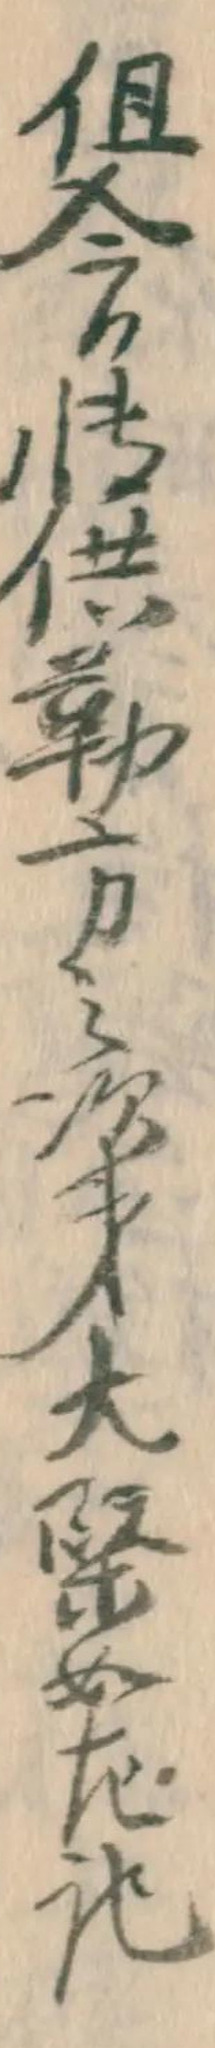但今日轉供勤方之次第大緊如左記
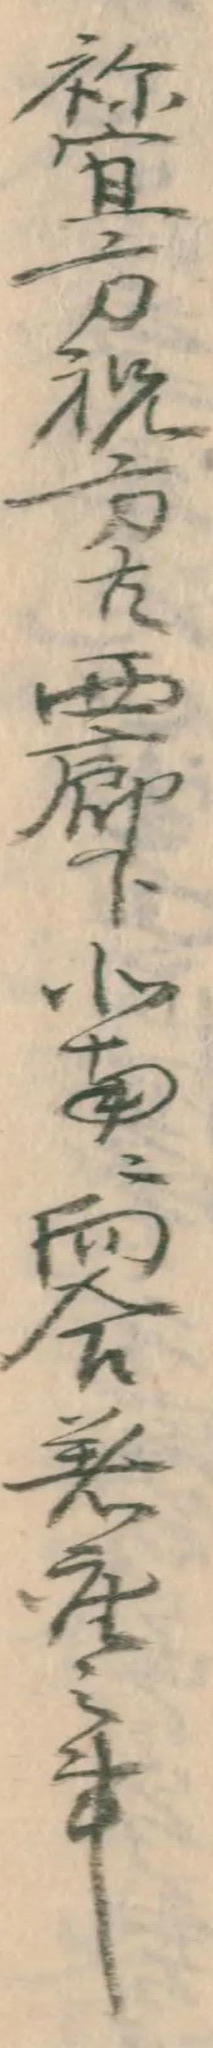祢宜方祝方共西廊下北南に向合着座之事
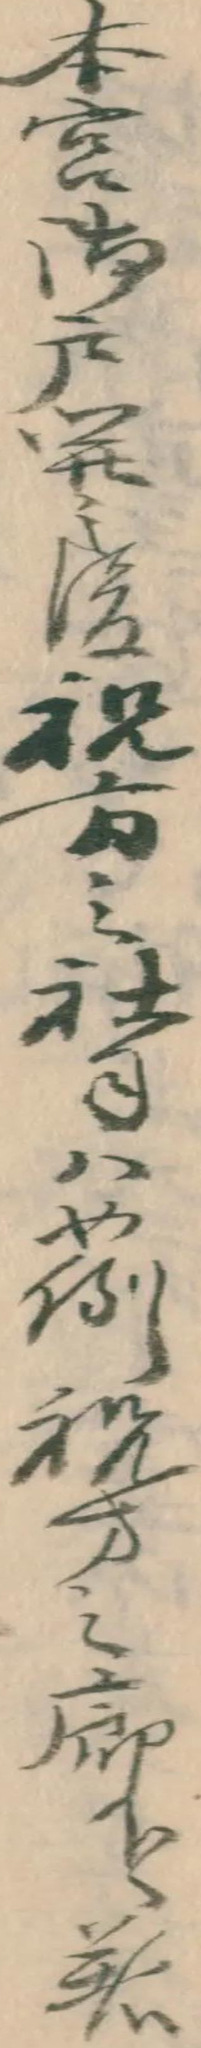本宮御戸開之後祝方之社司ハ如例祝方之廊下へ着
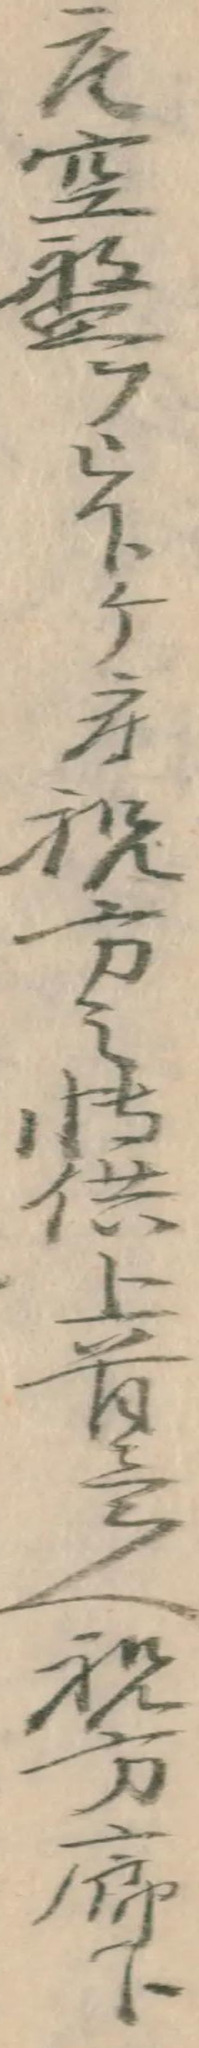座空盤ヲ被下ケニ付祝方之轉供上首壱人祝方廊下
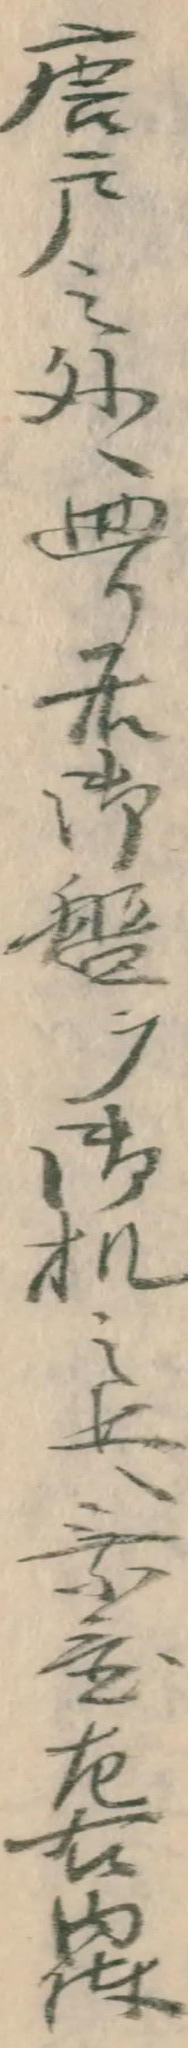唐戸之外へ廻り居御盤ヲ御机之上へ乗置左右内陣
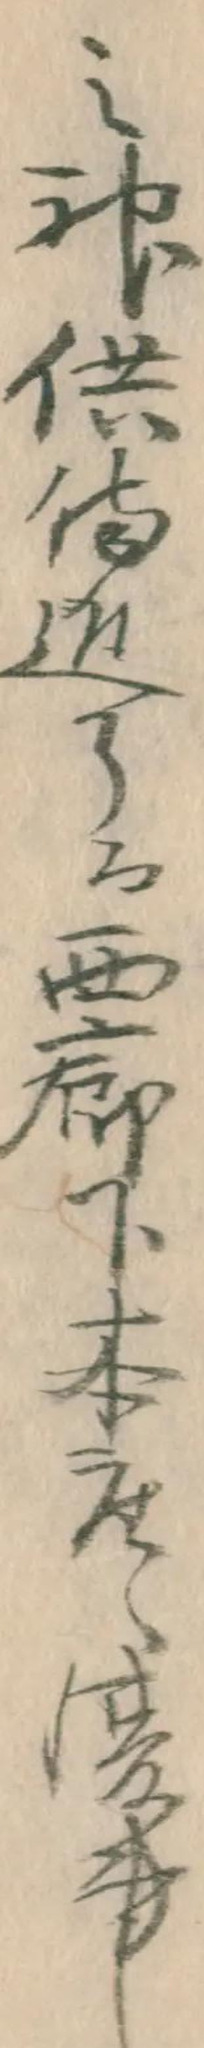之神供備進了而西廊下本座へ復事
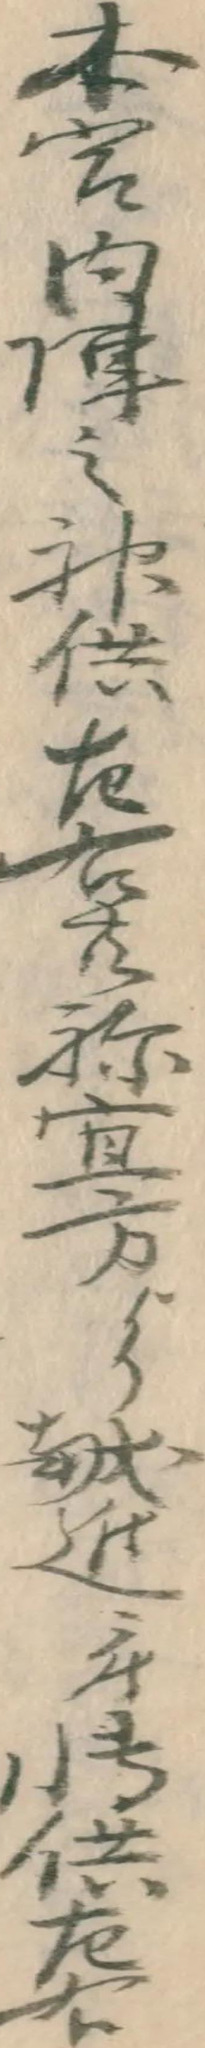本宮内陣之神供左右共称宜方より献進ニ付轉供左右
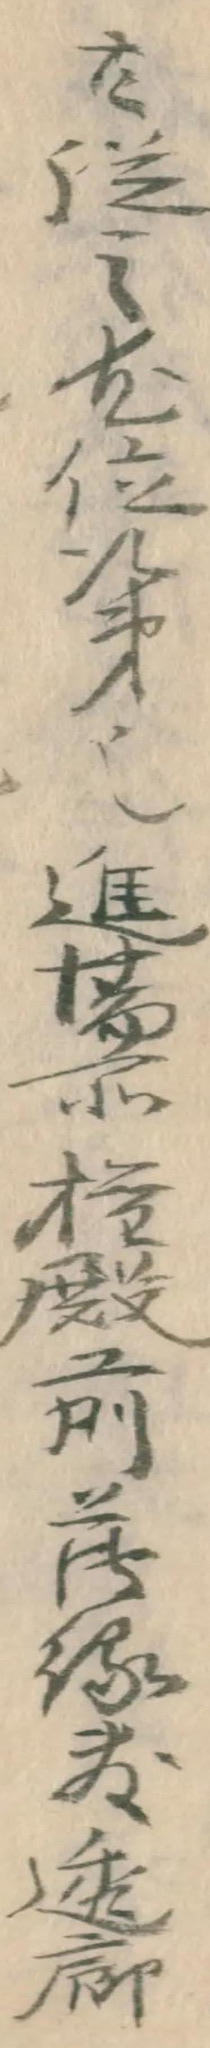共従之尤位次第也進場所権殿前落縁敷透廊
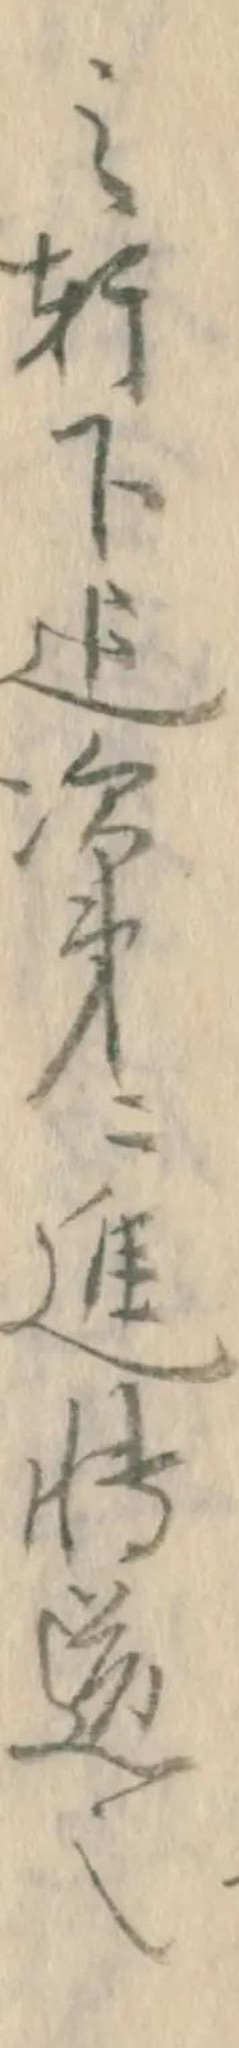之軒下迄次第に進轉道之
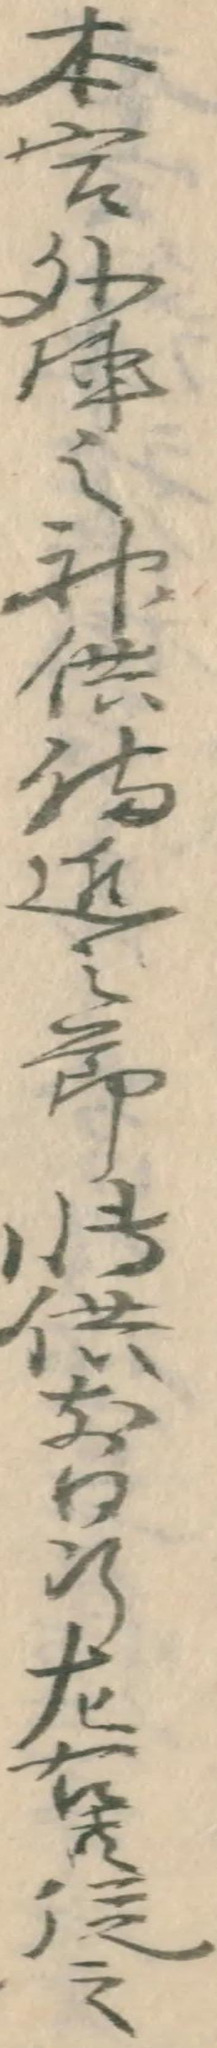本宮外陣之神供備進之節傳供前同断左右共従之
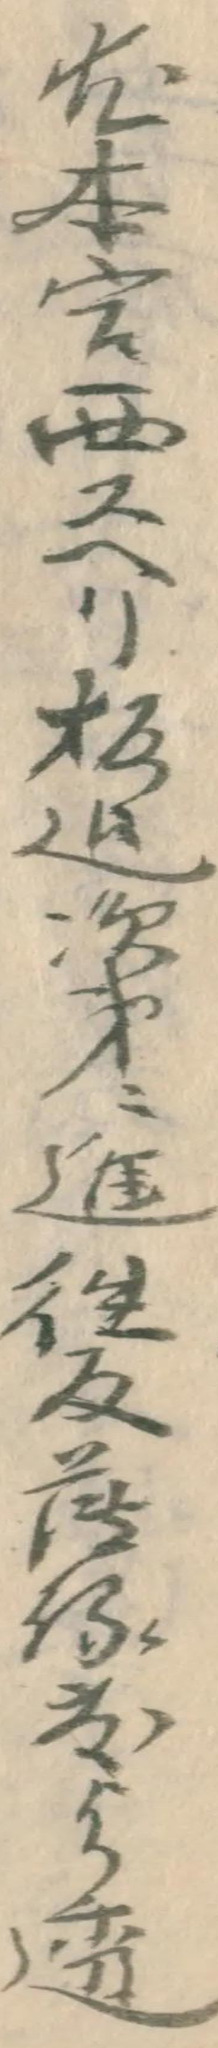尤本宮西スヘリ板進次第ニ進往反落縁敷より透
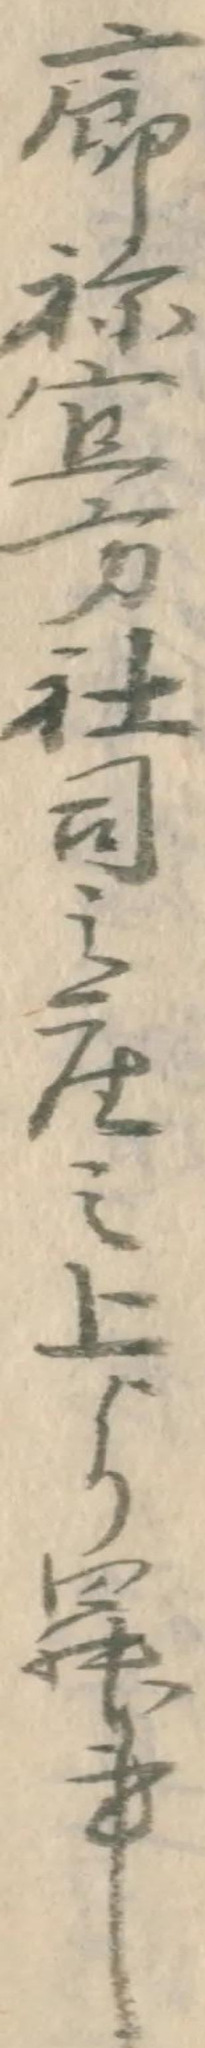廊祢宜方社司之座之上より昇事
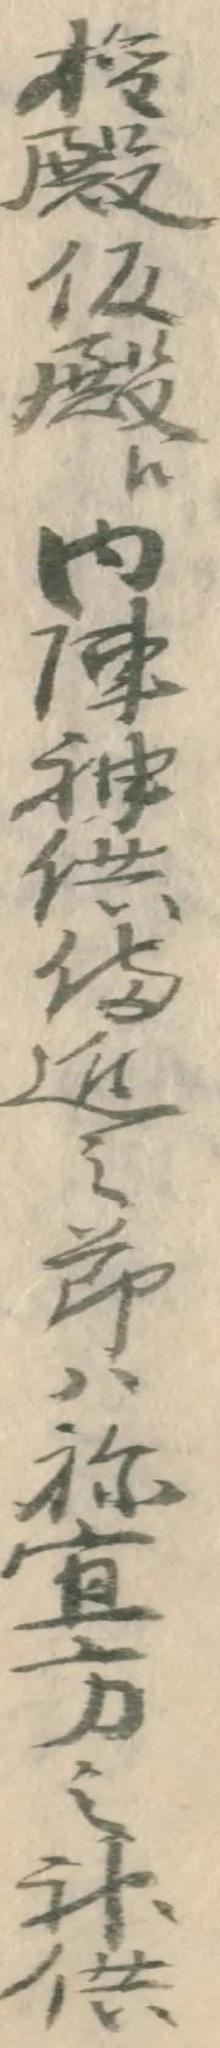権殿仮殿え内陣神供備進之節ハ称宜方之神供
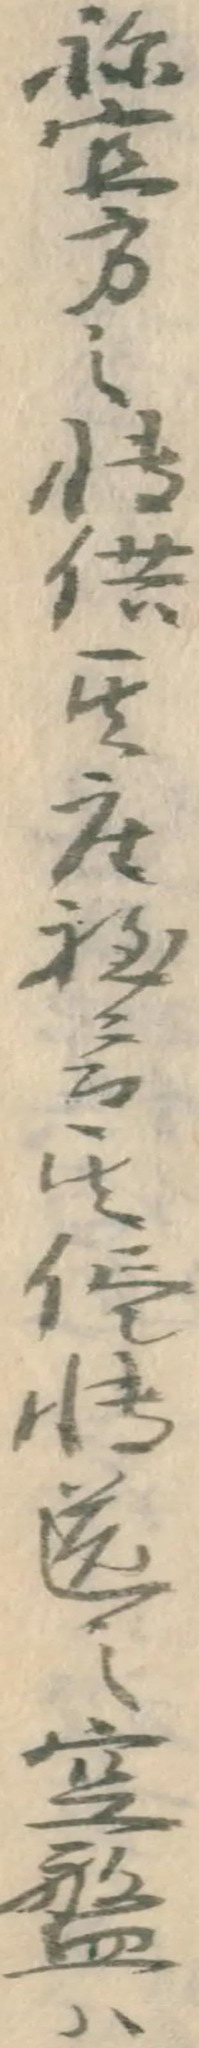祢宜方之轉供其座程にて其侭轉送之空盤ハ

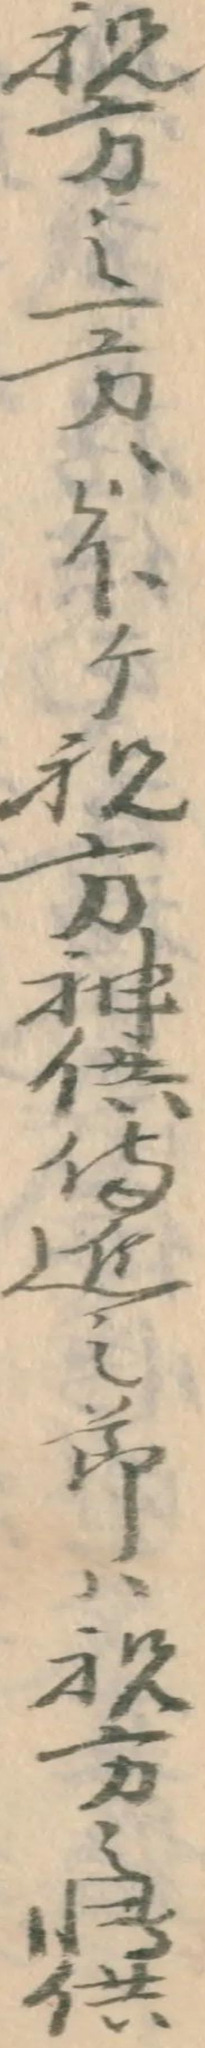祝方之一方へ被下ヶ祝方神供備進之節ハ祝方之轉供
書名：賀茂社記録. 第66冊
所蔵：国立国会図書館 National Diet Library, JAPAN
